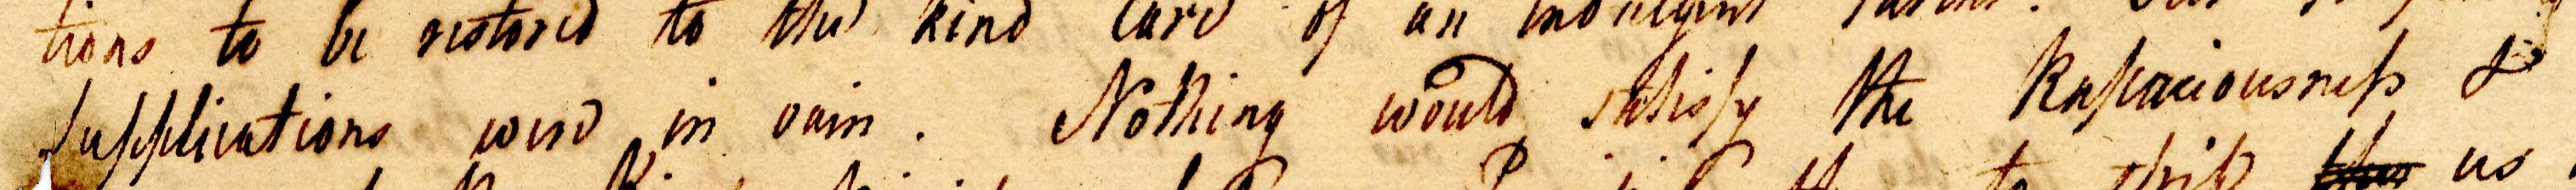Supplications were in vain. Nothing would satisfy the Rapaciousness &
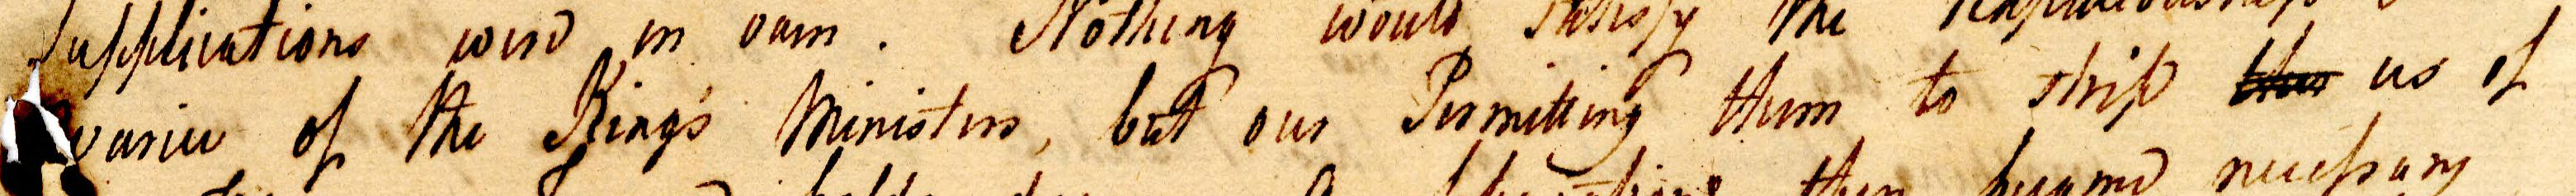Avarice of the King's Ministers, but our Permitting them to strip [____] us of
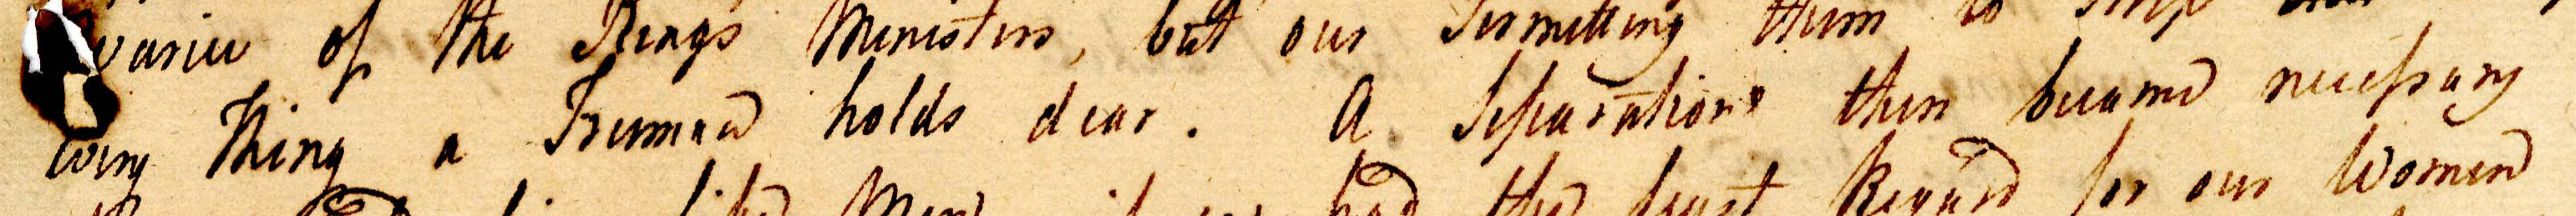every thing a Freeman holds dear. A Separation then became necessary
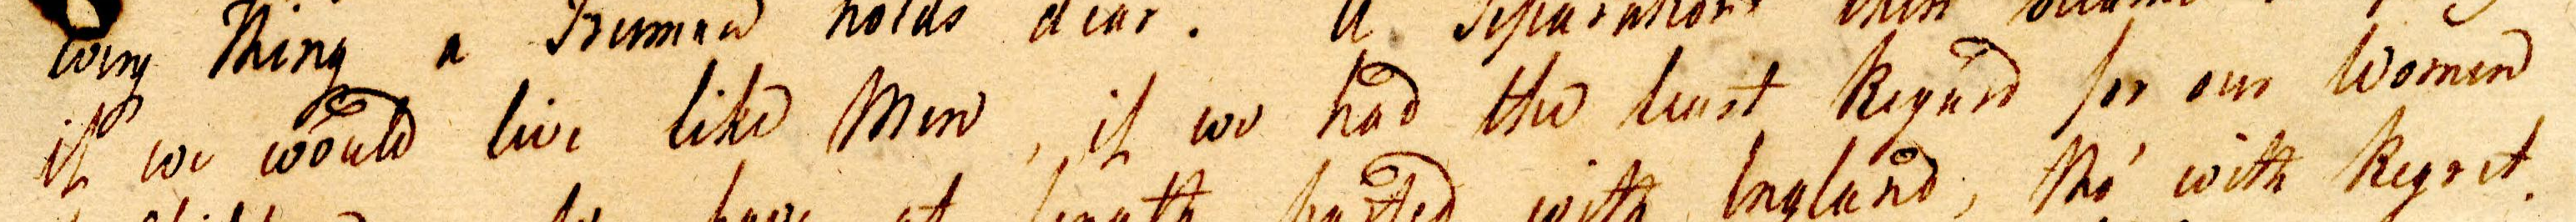if we would live like Men, if we had the least Regard for our Women
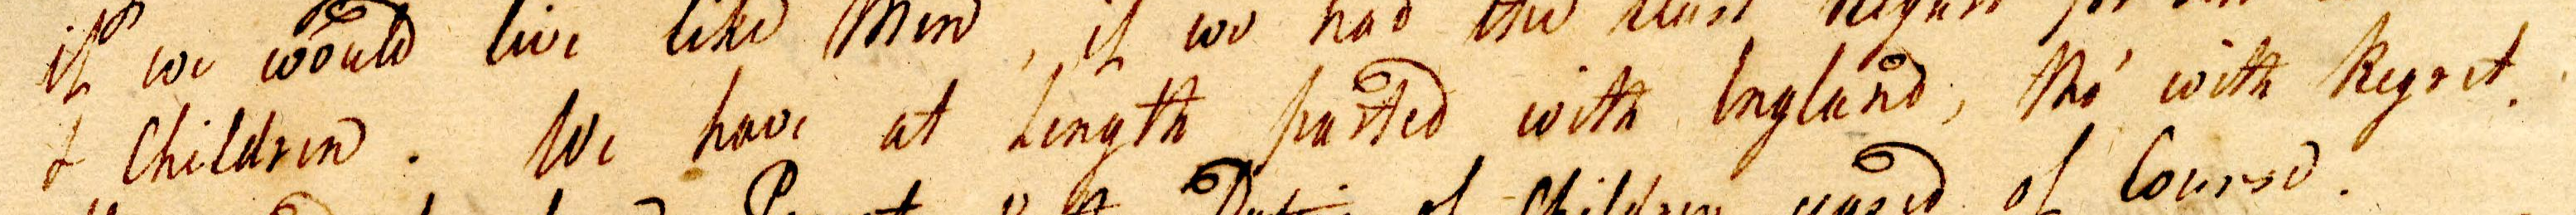& Children. We have at Length parted with England, tho' with Regret.
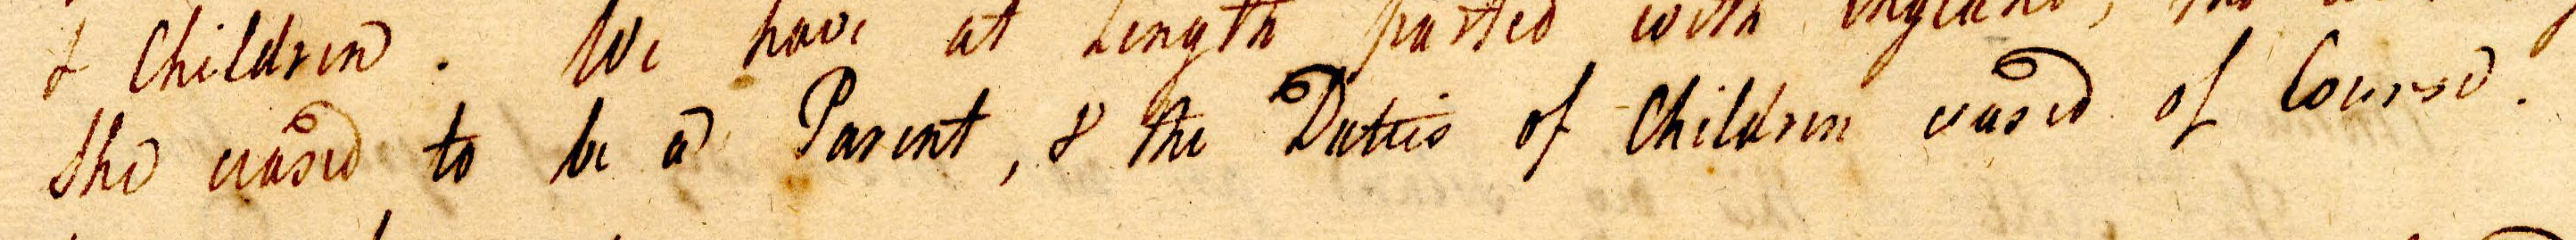she ceased to be a Parent, & the Duties of Children ceased of Course.
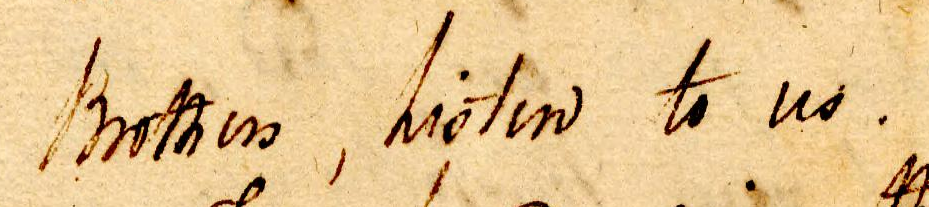Brothers, Listen to us.
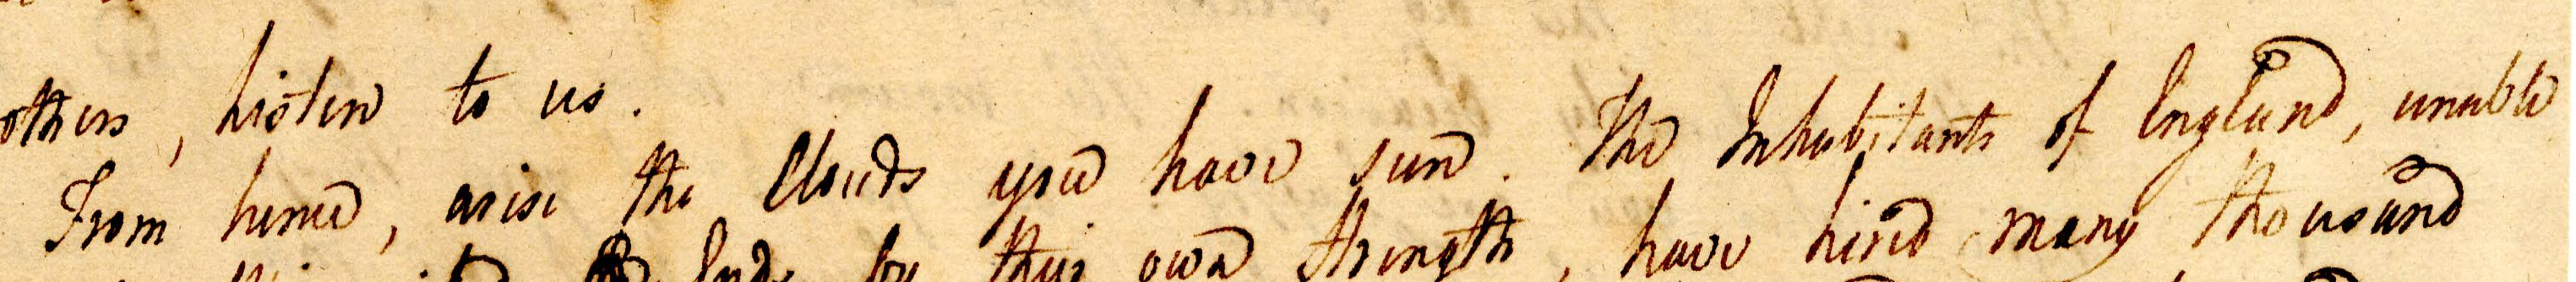From hence, arise the clouds you have seen. The Inhabitants of England, unable
